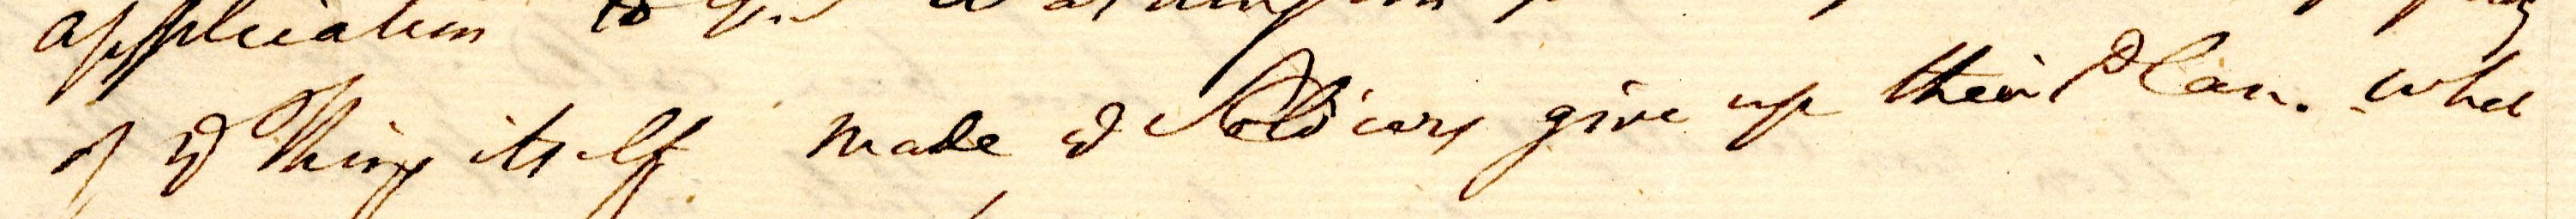of y^e Thing itself made y^e Soldiers give up their Plan what
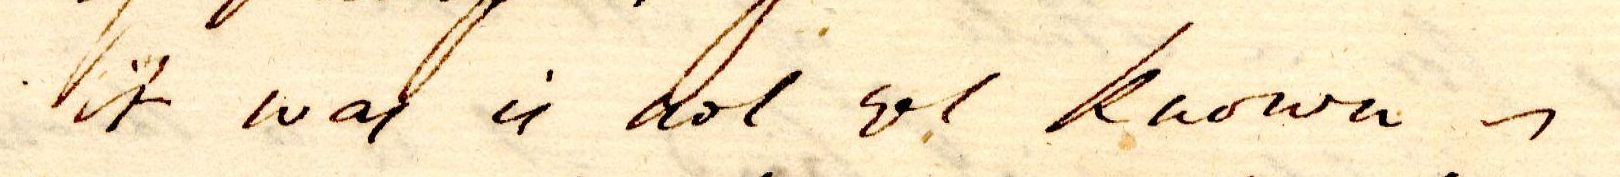it was is not yet known.
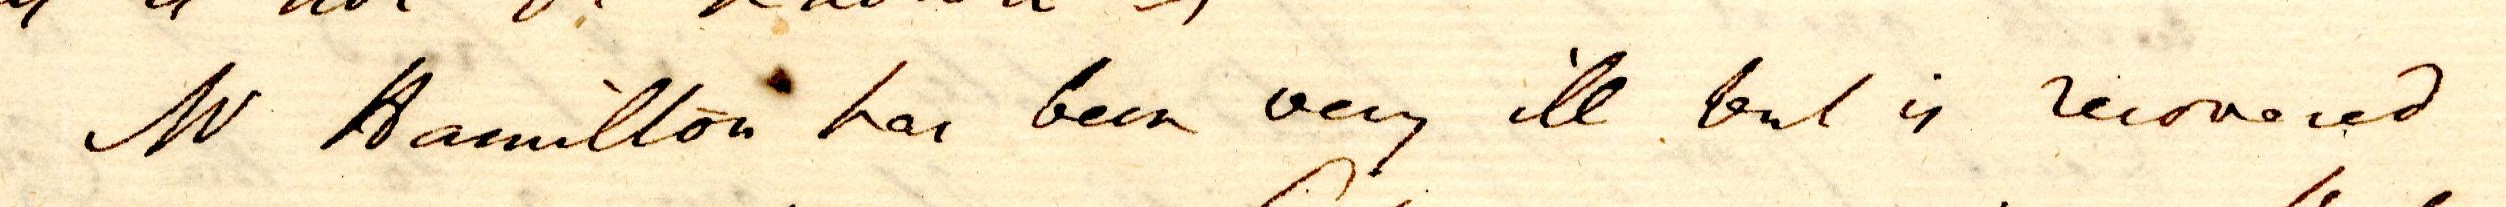M^r Hamilton has been very ill but is recovered
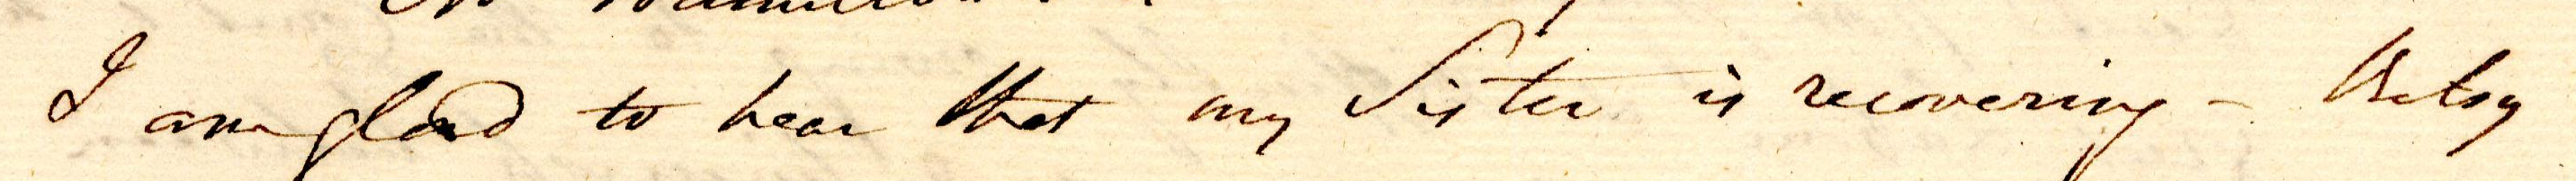I am glad to hear that my Sister is recovering- Betsy
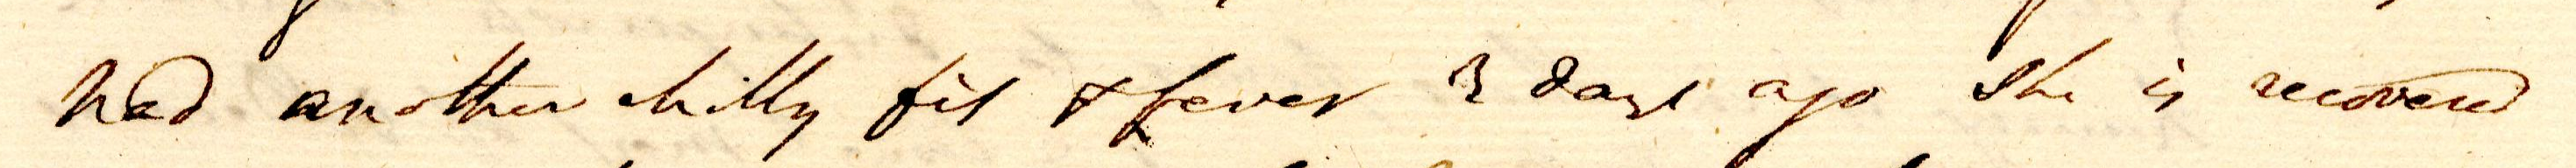had another chilly fit & fever 3 days ago she is recovered
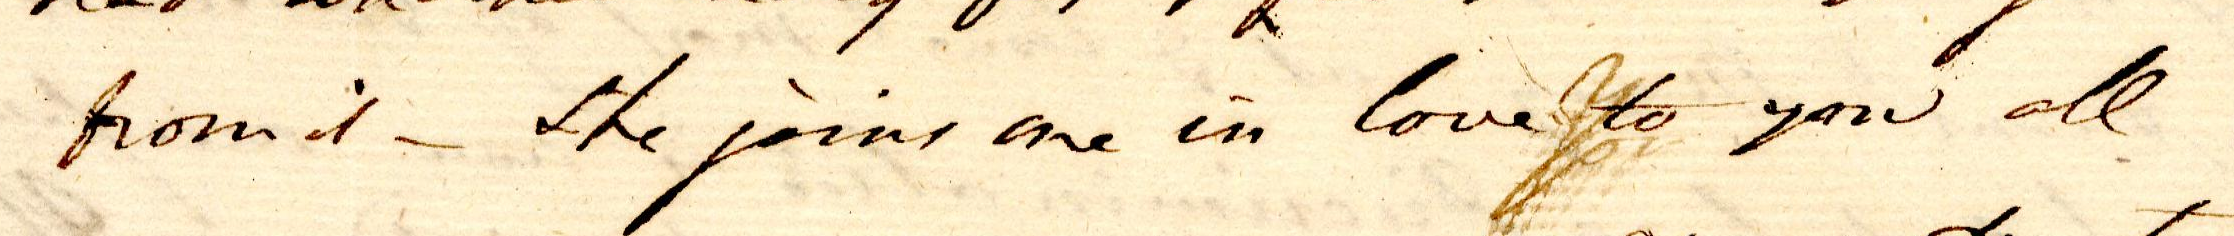from it- She joins one in love to you all
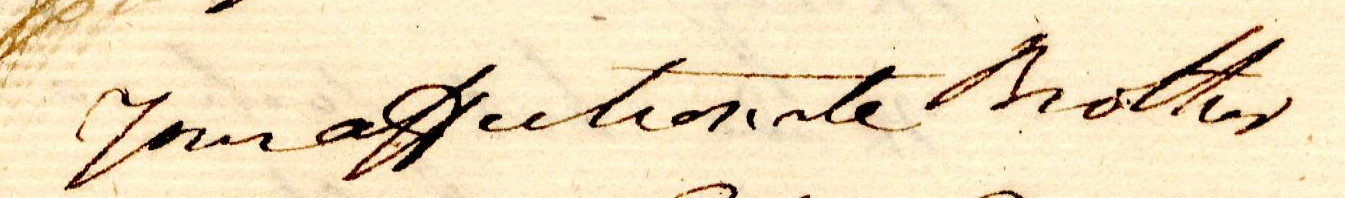Your affectionate Brother
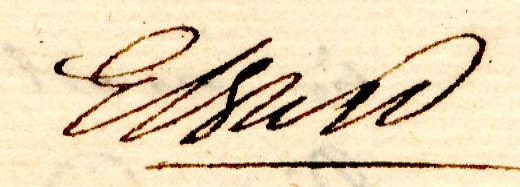E Burd
